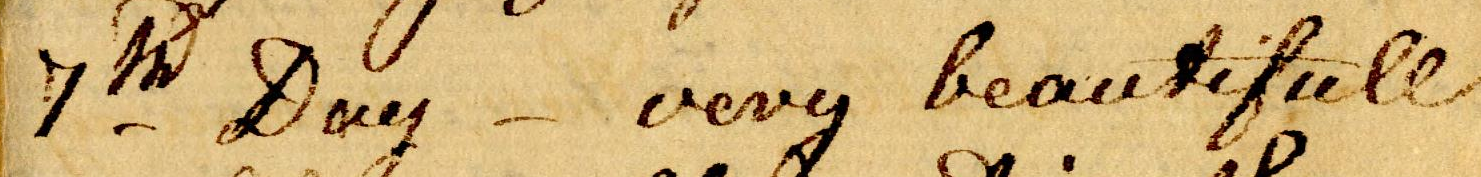7^th Day- very beautifull
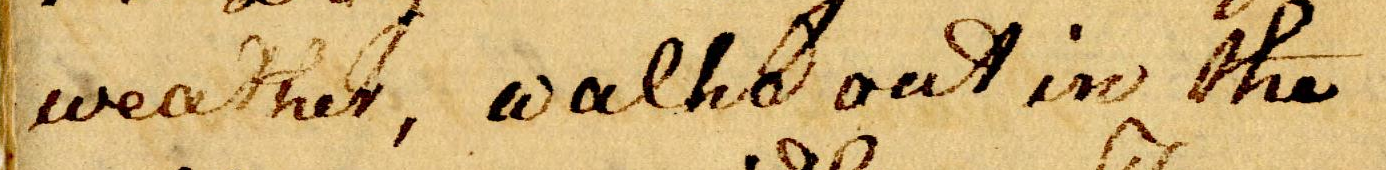weather, walkd out in the
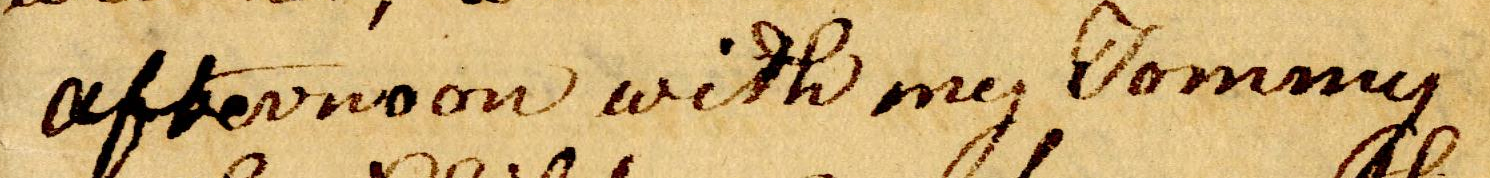afternoon with my Tommy
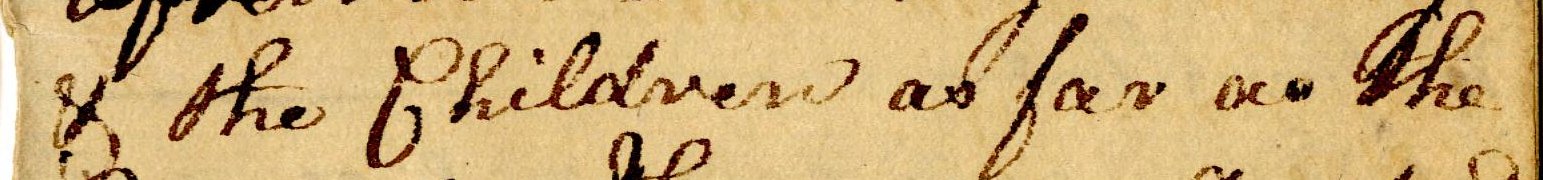& the Children as far as the
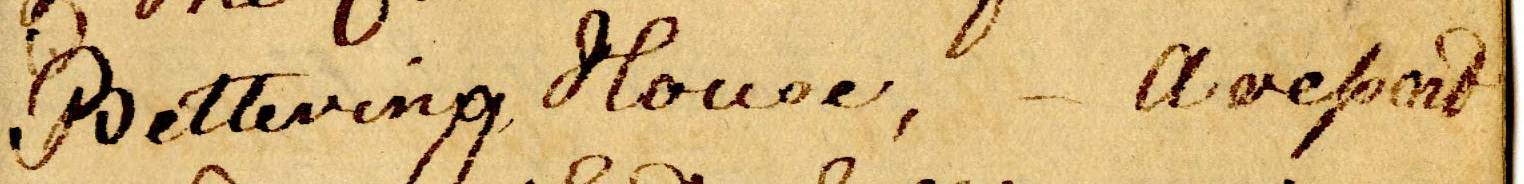Bettering House,- A report
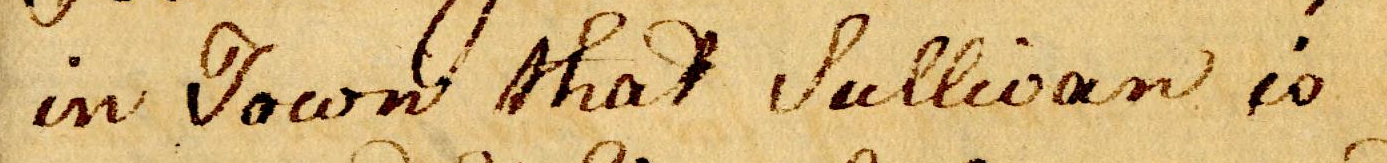in Town that Sullivan is
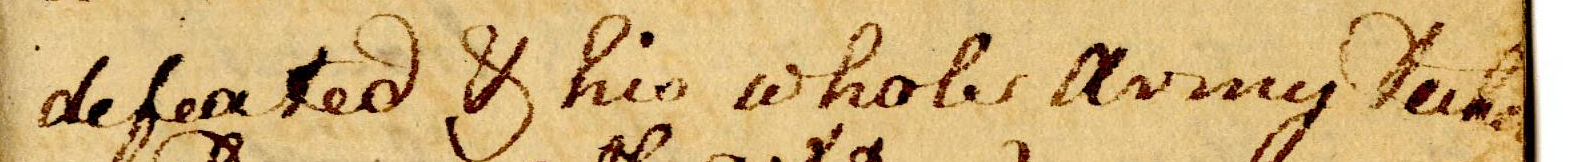defeated & his whole Army take
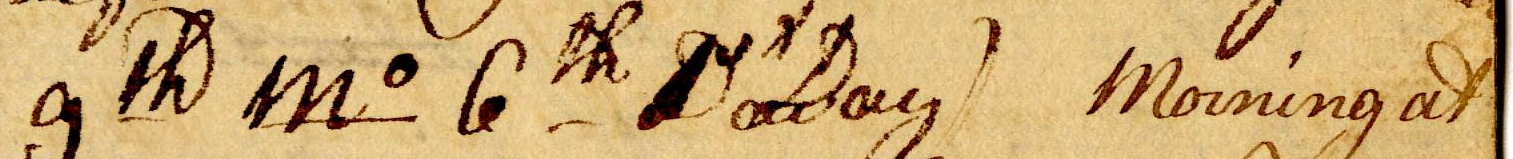9^th M^o 6^th) 1^st Day) Morning at
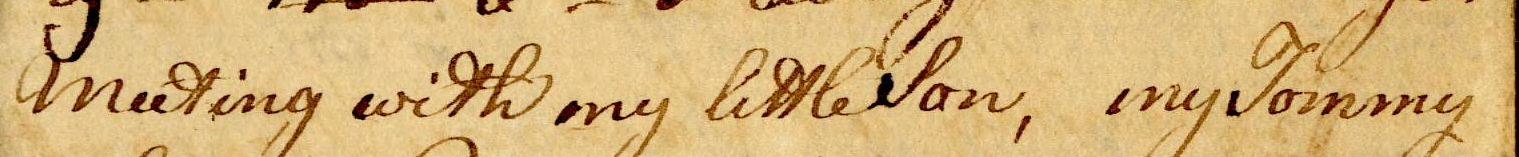Meeting with my little Son, my Tommy
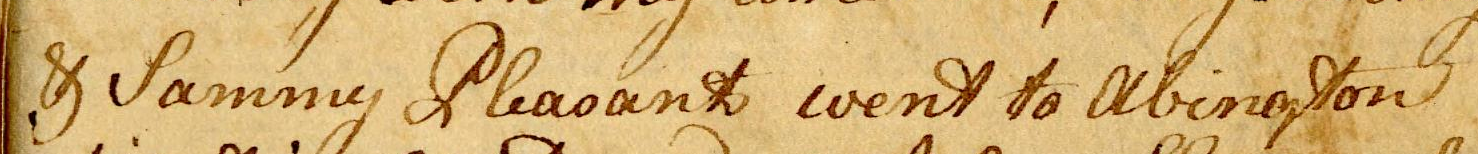& Sammy Pleasants went to Abington
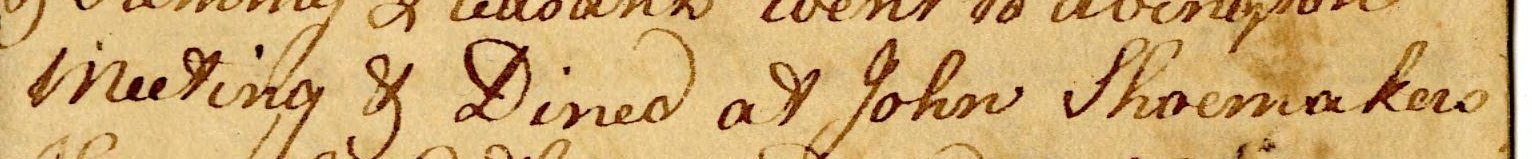Meeting & Dined at John Shoemakers
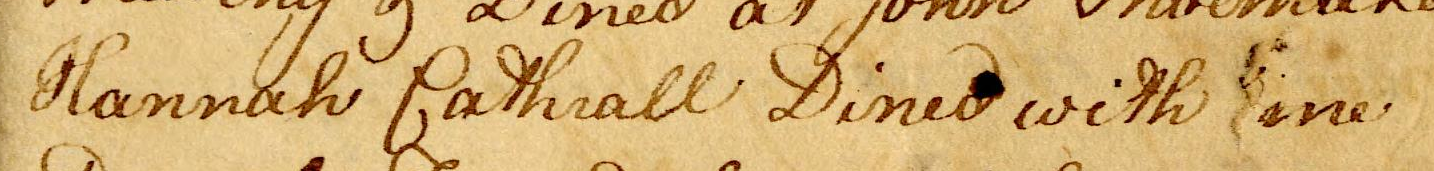Hannah Cathrall Dined with me
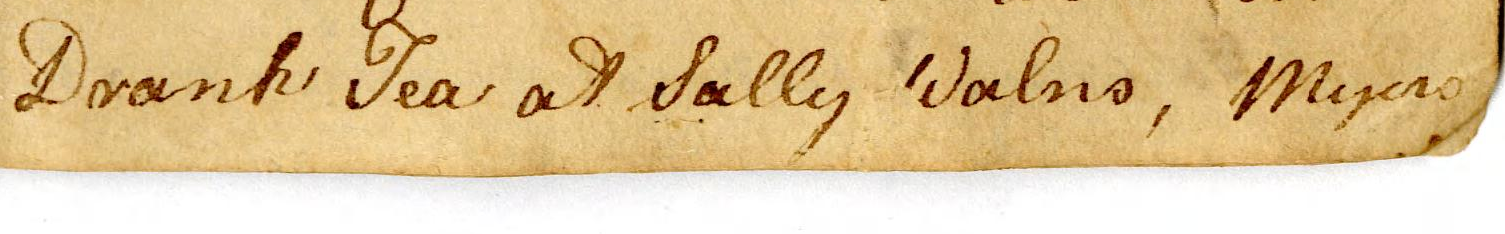Drank Tea at Sally Walns, Myers
